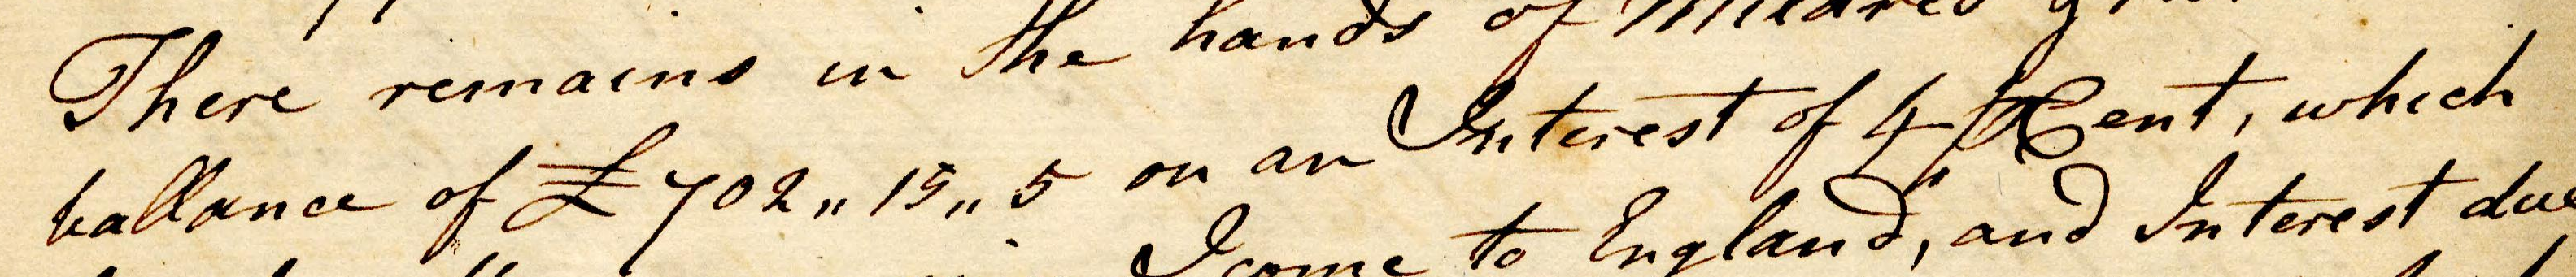ballance of £ 702..19.. 5 on an Interest of 4 PerCent, which
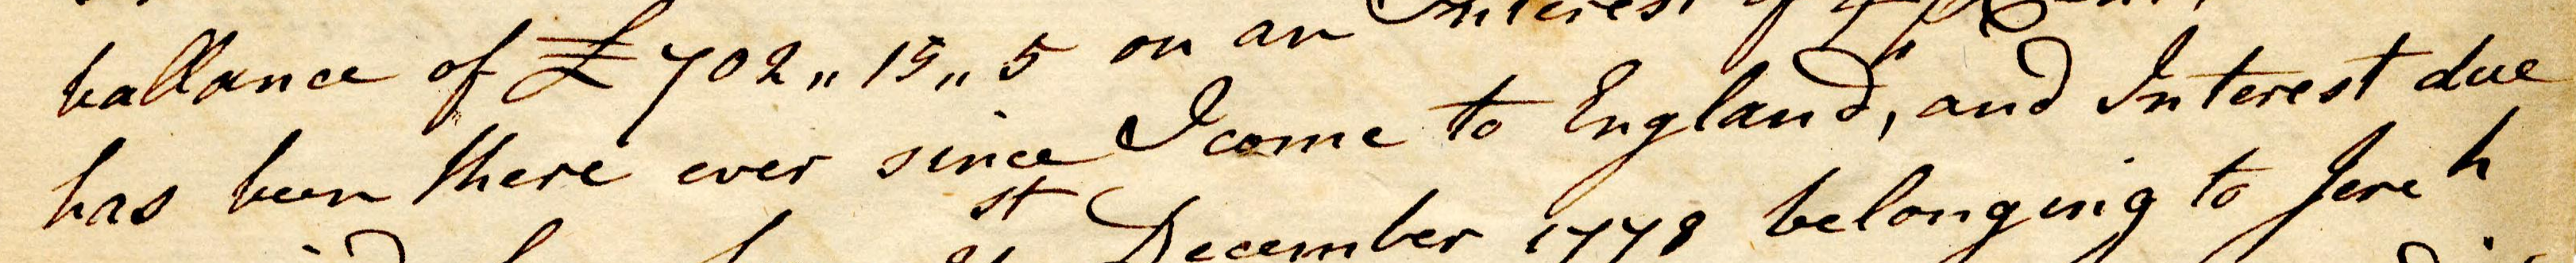has been there ever since I come to England, and Interest due
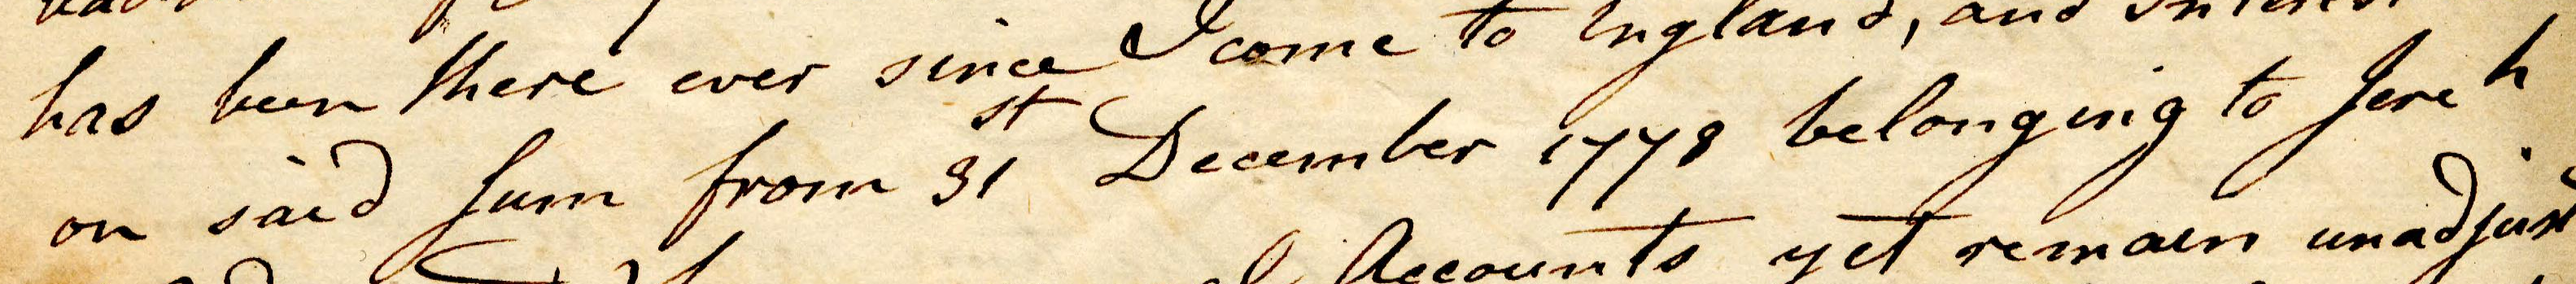on said sum from 31^st December 1778 belonging to Jere^h
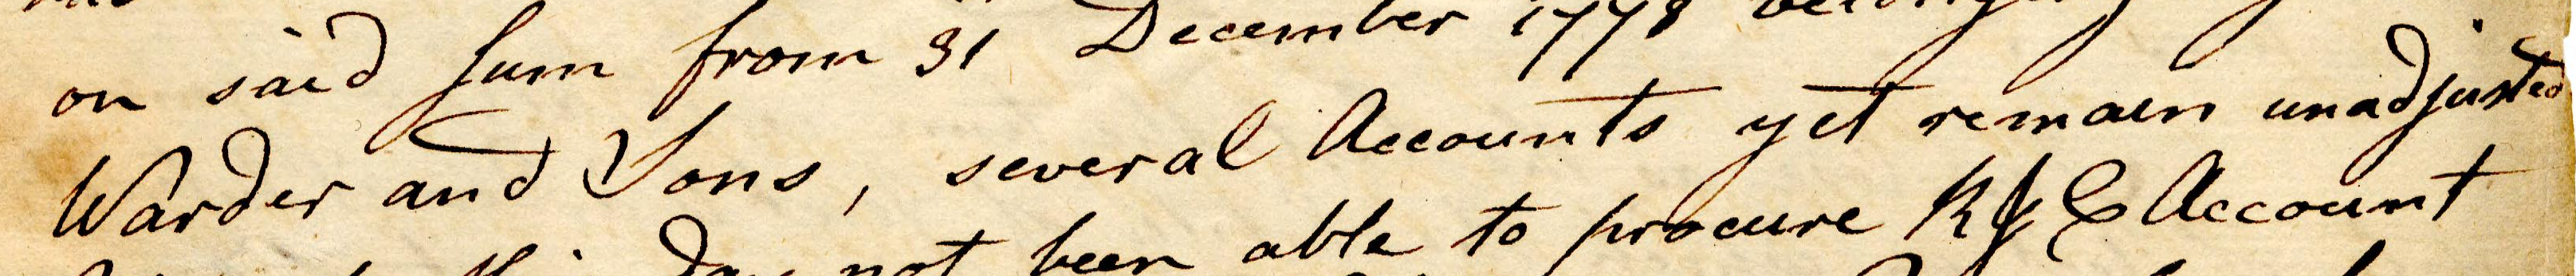Warder and Sons, several Accounts yet remain unadjusted
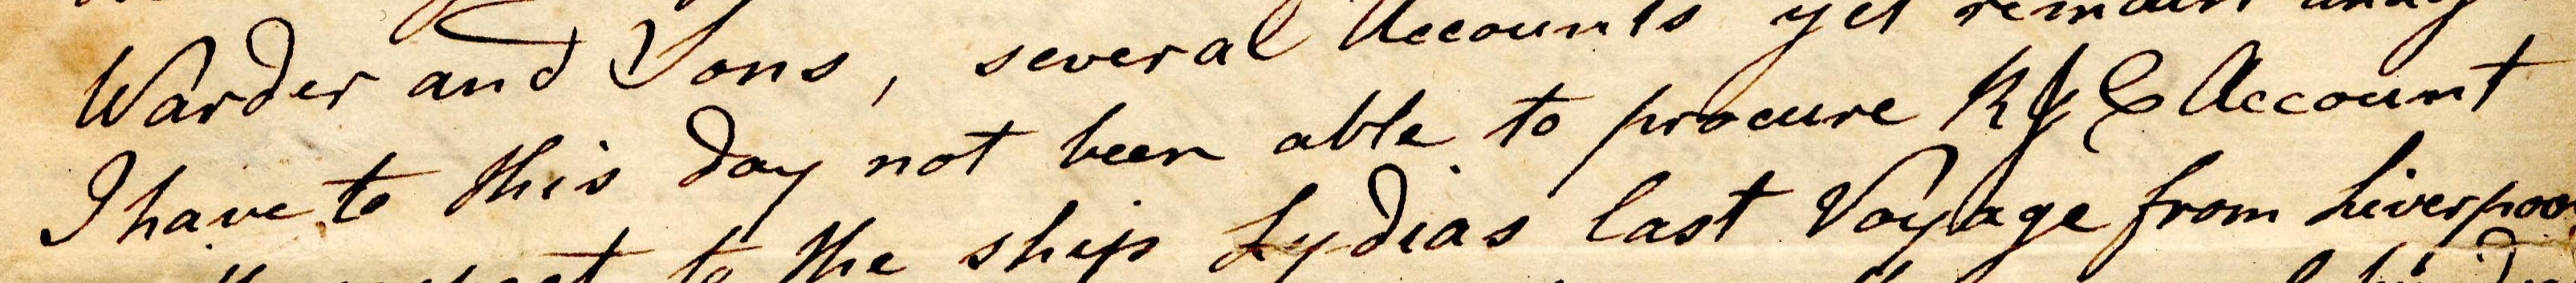I have to this day not been able to procure RJC Account
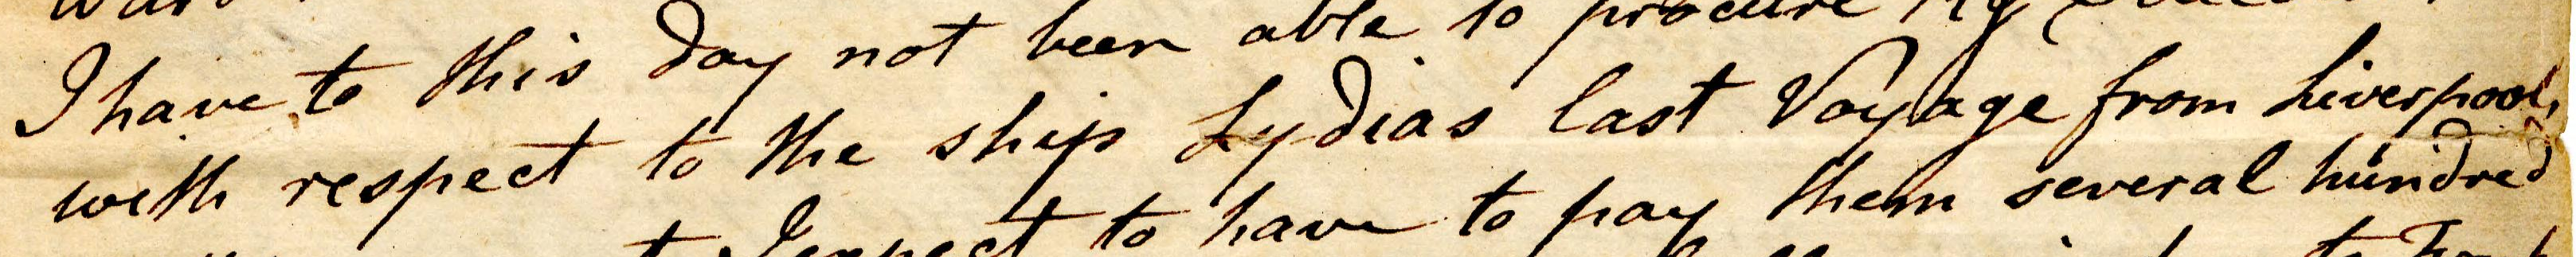with respect to the ships Lydias last Voyage from Liverpool,
